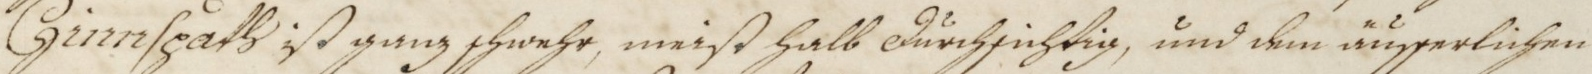Zinnspath ist ganz schwehr, meist halb durchsichtig, und dem äusserlichen
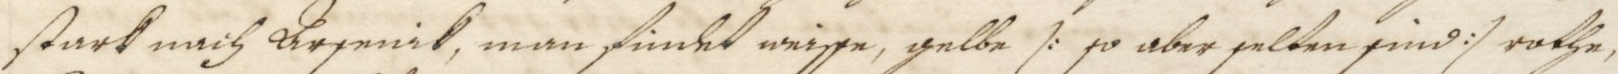stark nach Arsenik, man findet weisse, gelbe (so aber selten sind) rothe,
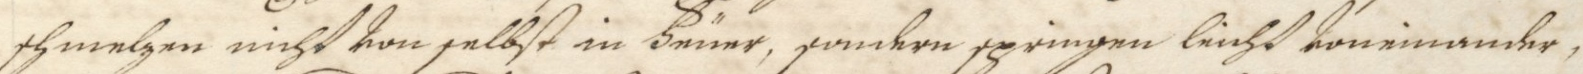schmelzen nicht von selbst in Feüer, sondern springen leicht voneinander,
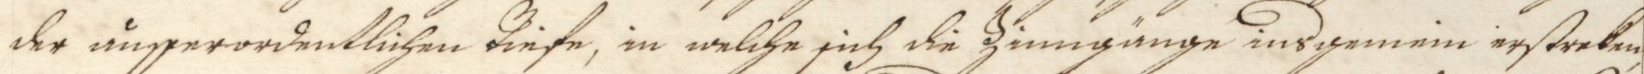der ausserordentlichen Tiefe, in welche sich die Zinngänge insgemein erstreken,
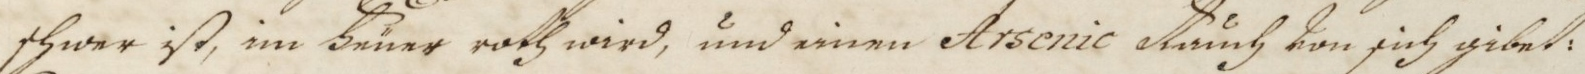schwer ist, im Feüer roth wird, und einen Arsenic Rauch von sich gibet.
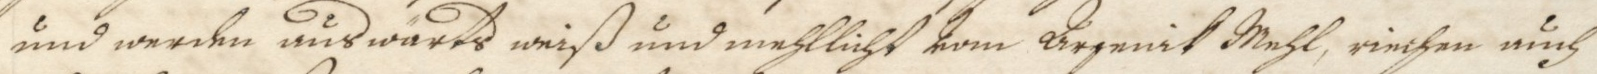und werden auswärts weiß und mehllicht vom Arzenik Mehl, riechen auch
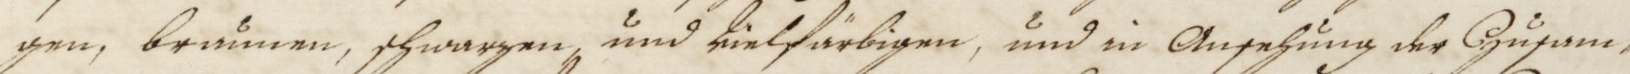gen, braunen, schwarzen, und vielfärbigen, und in Ansehung der Zusam-
